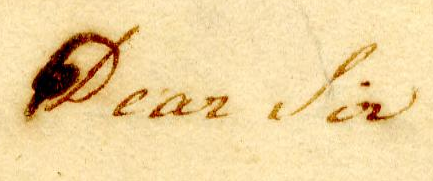Dear Sir
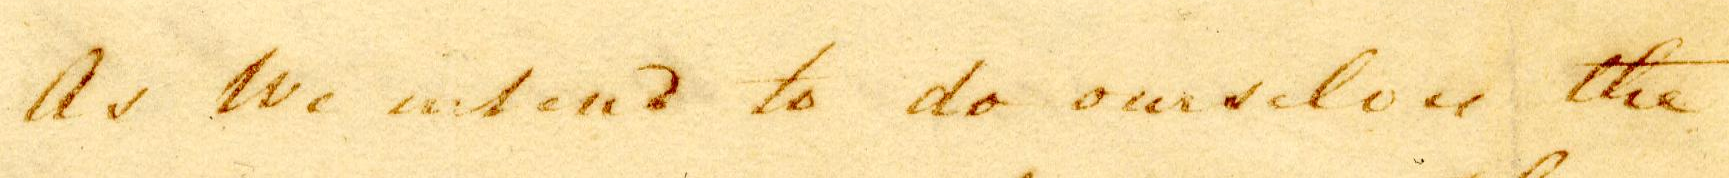As We intend to do ourselves the
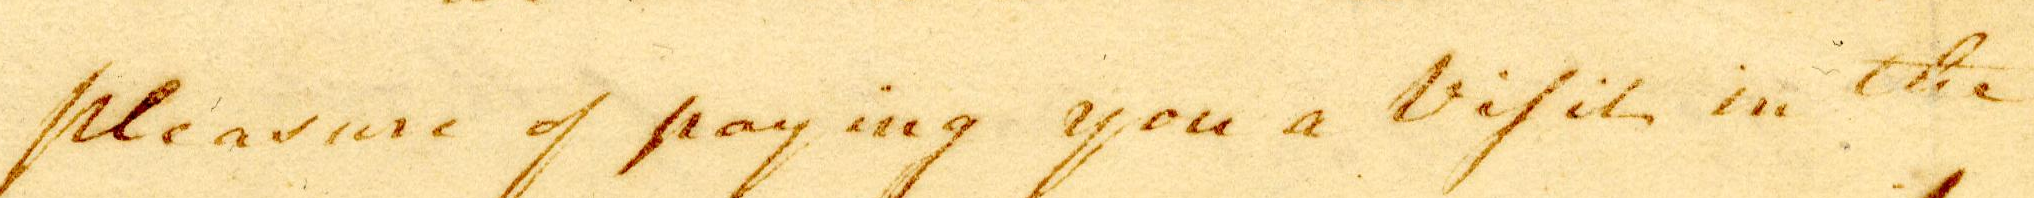pleasure of paying you a Visit in the
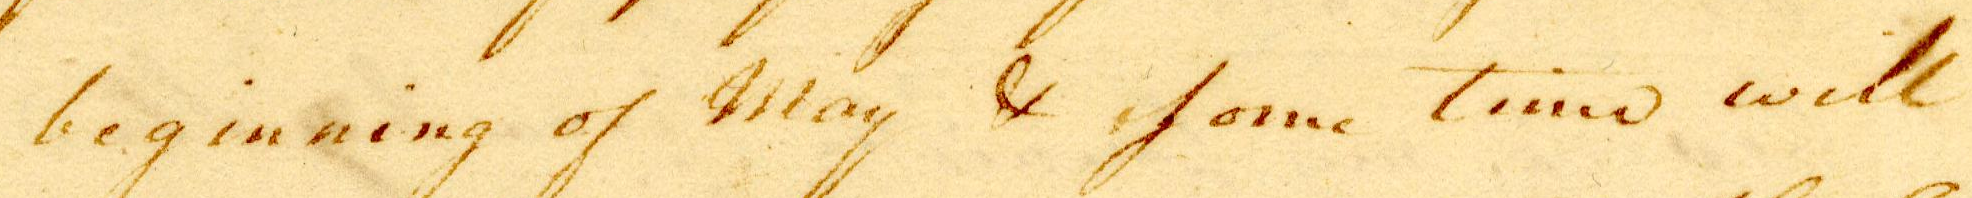beginning of May & some time will
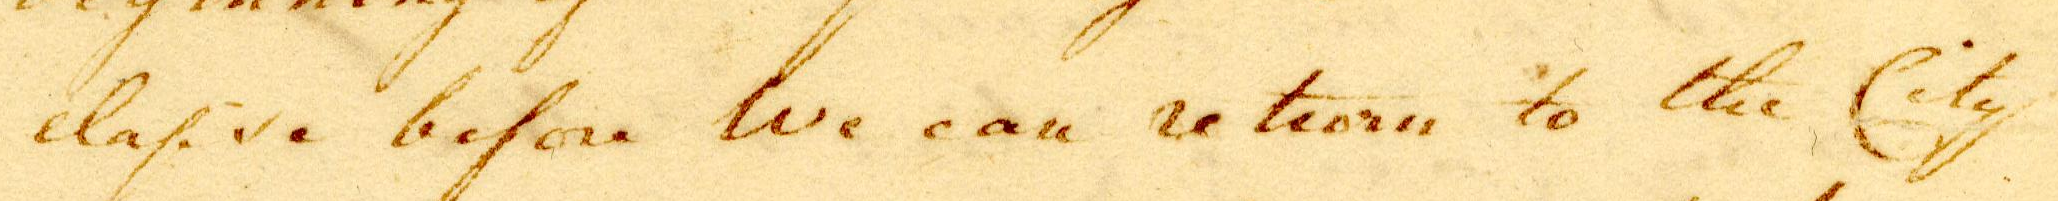elapse before We can return to the City
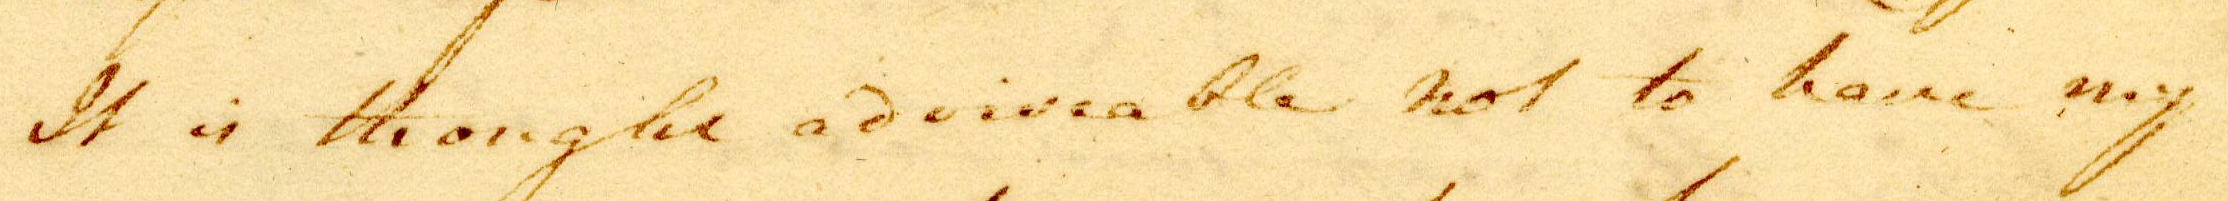It is thought advisable not to have my
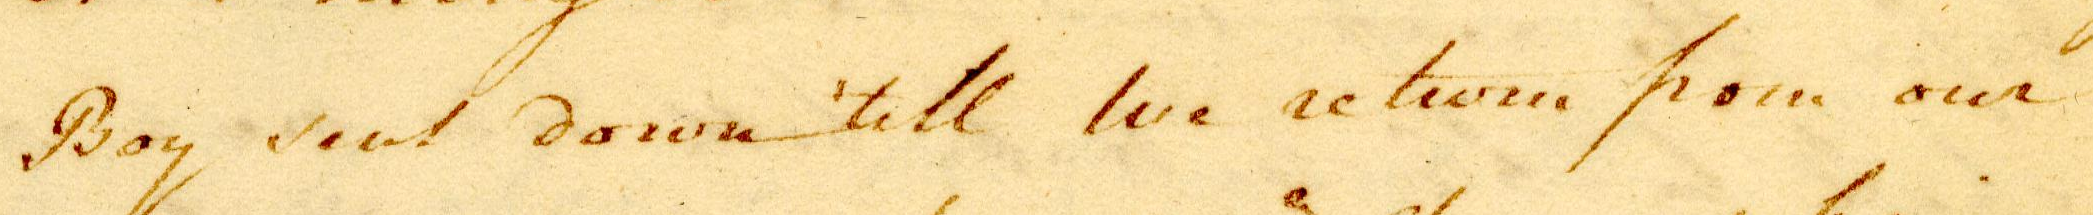Boy sent down 'till We return from our
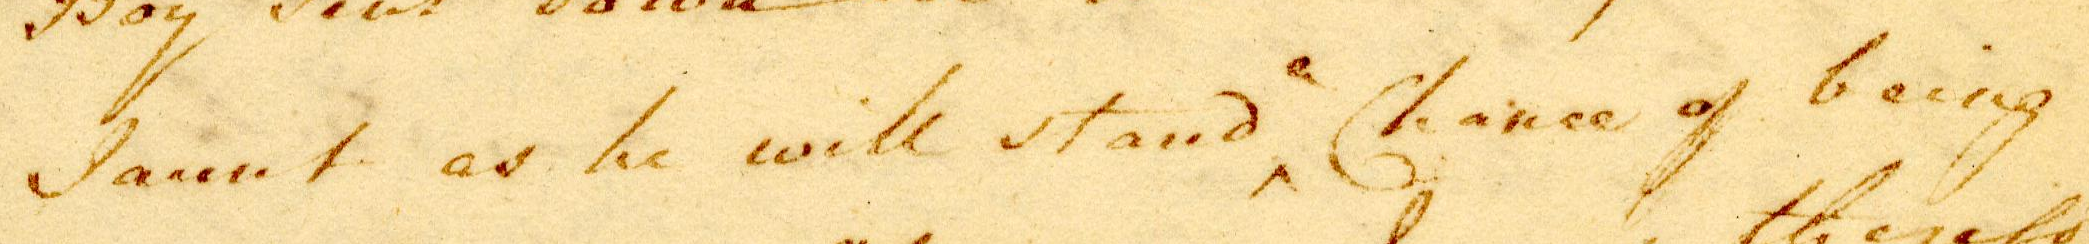Jaunt as he will stand Chance of being
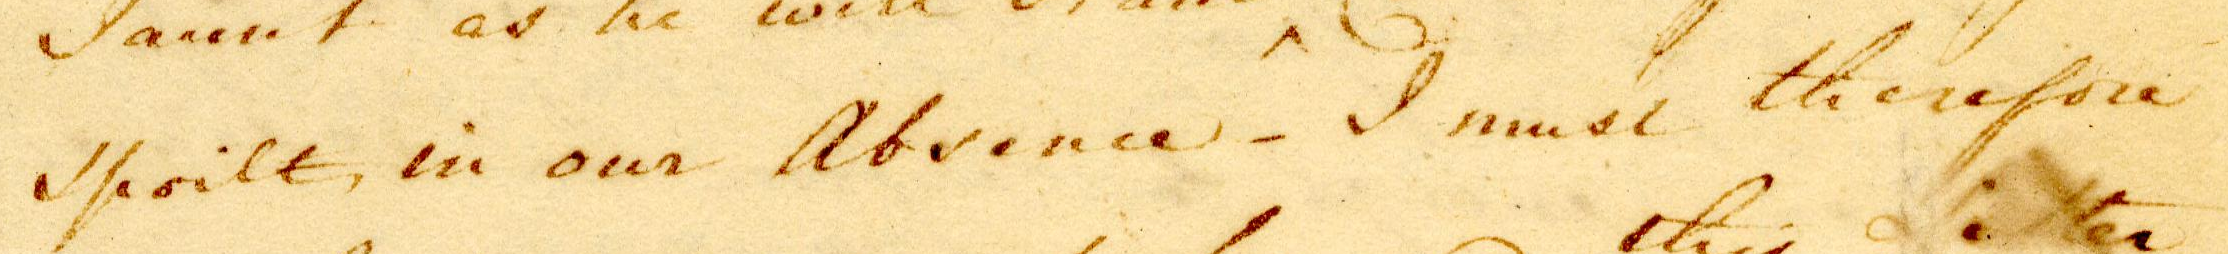spoilt, in our Absence. I must therefore
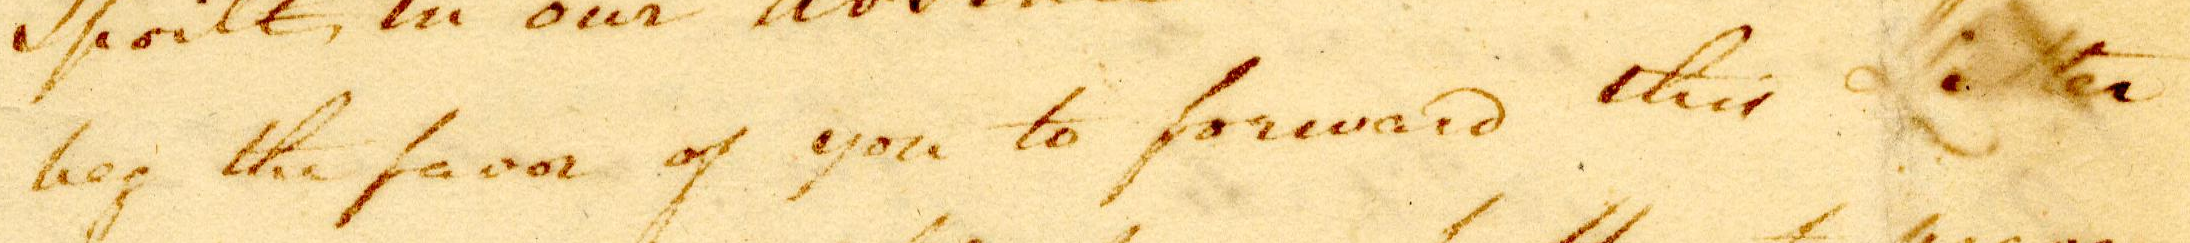beg the favor of you to forward this Letter
